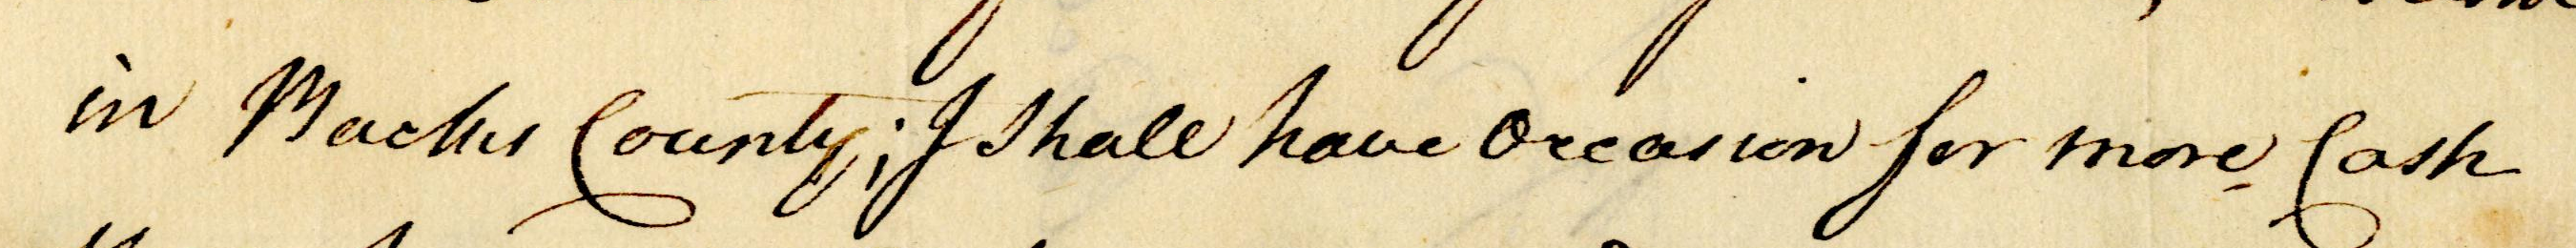in Macks County, I Shall have occasion for more Cash
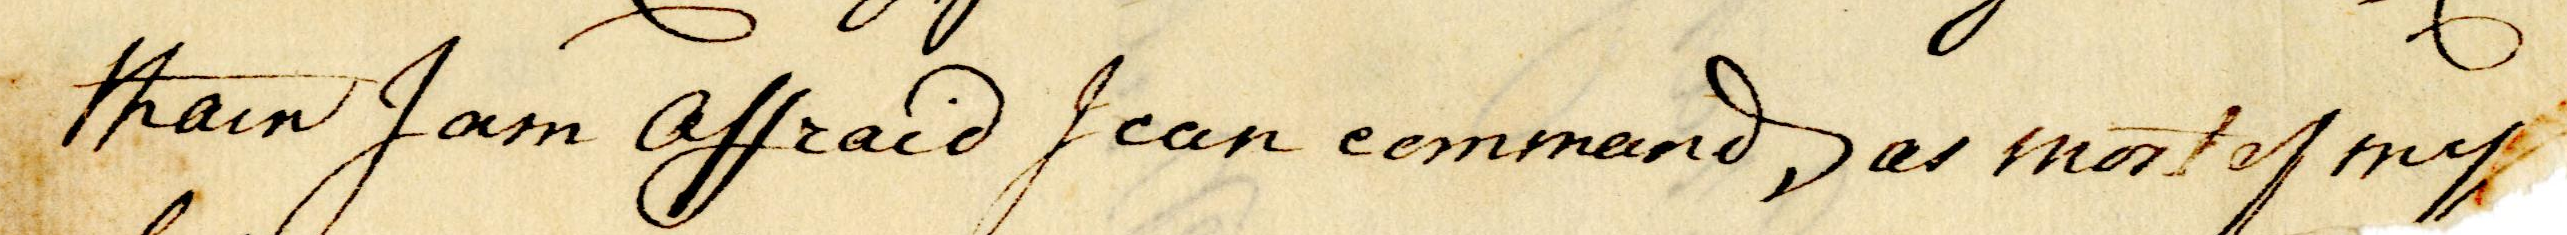than I am Affraid I can command, as most of my
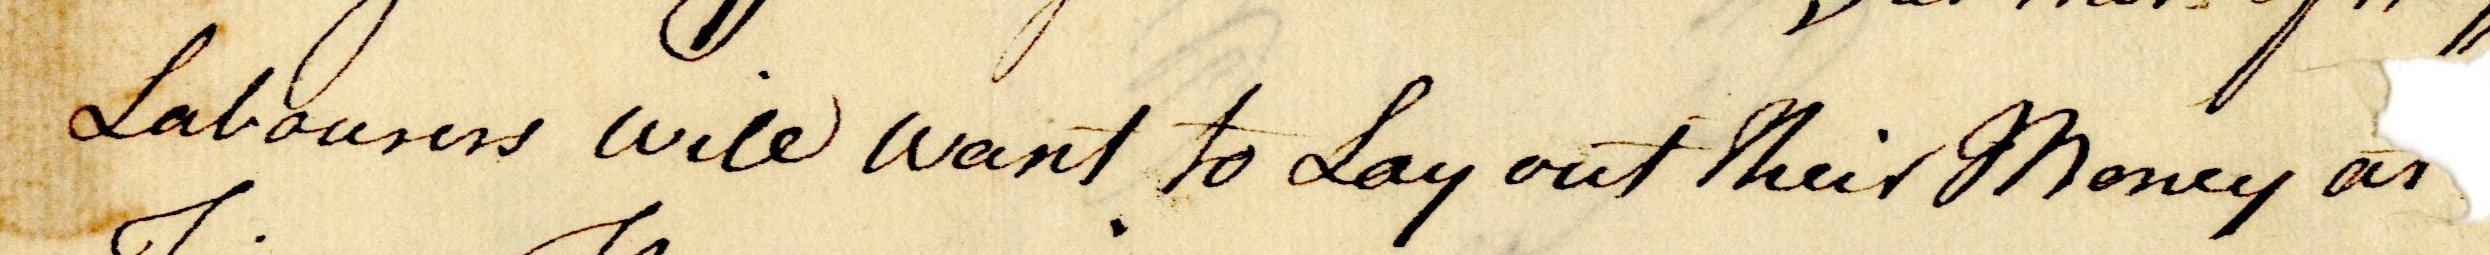Labourers will want to Lay out their Money as
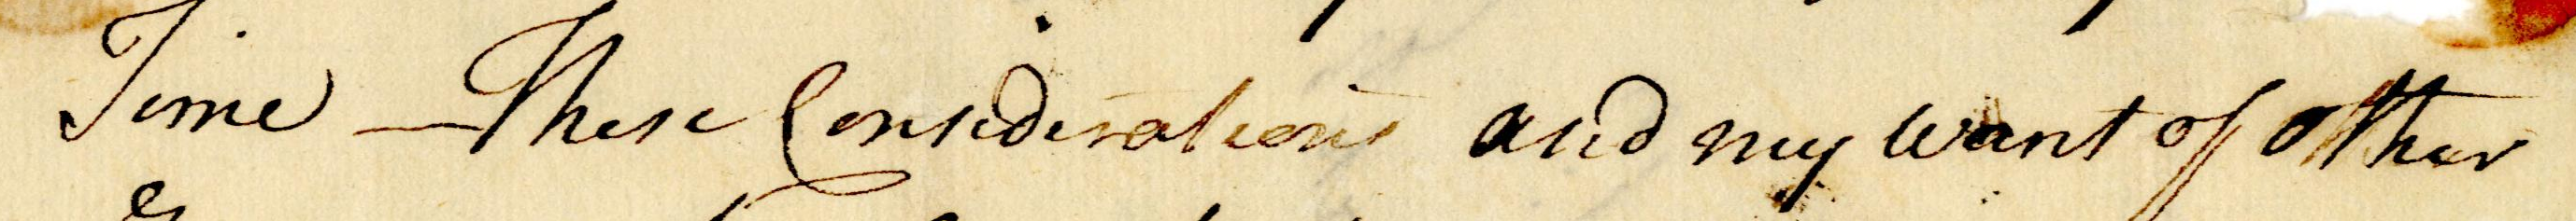Time- These Considerations and my want of other
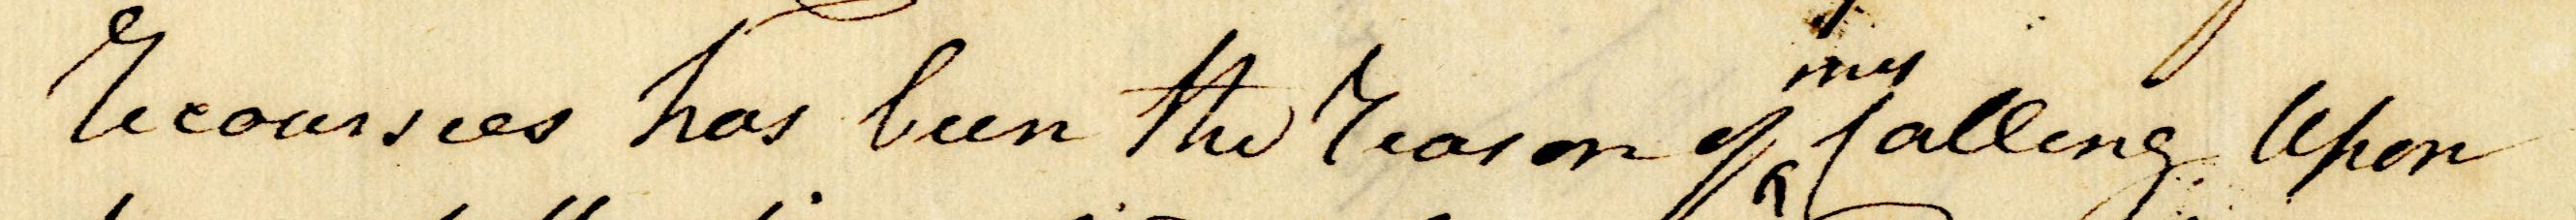recourses has been the Reason of ^ Calling Upon
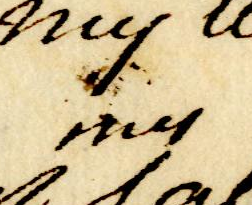my
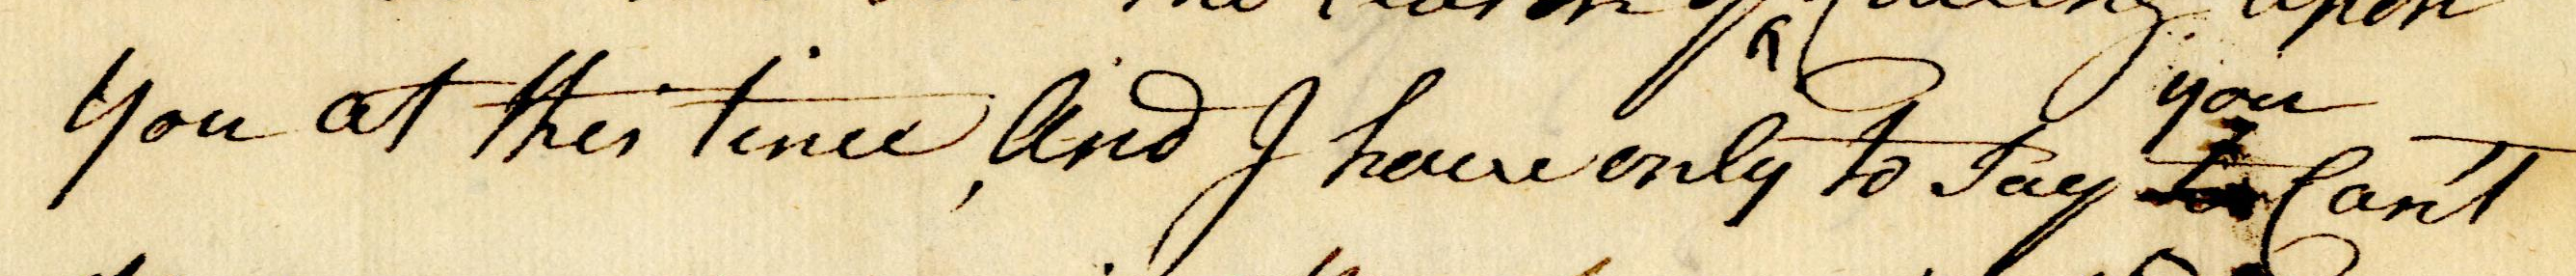You at this time, And I have only to Say [__] Can't
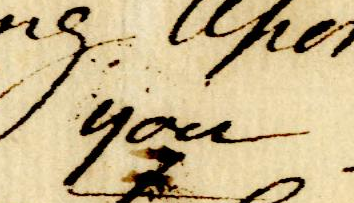you
